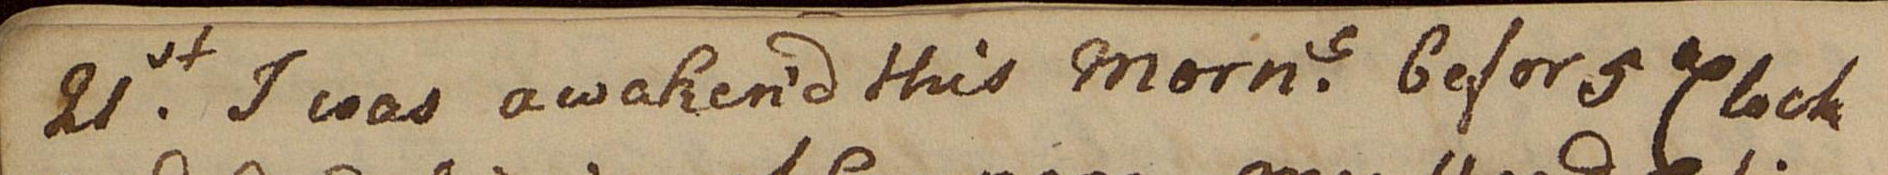21^st. I was awaken'd this Morn^g. befor 5 ^oClock
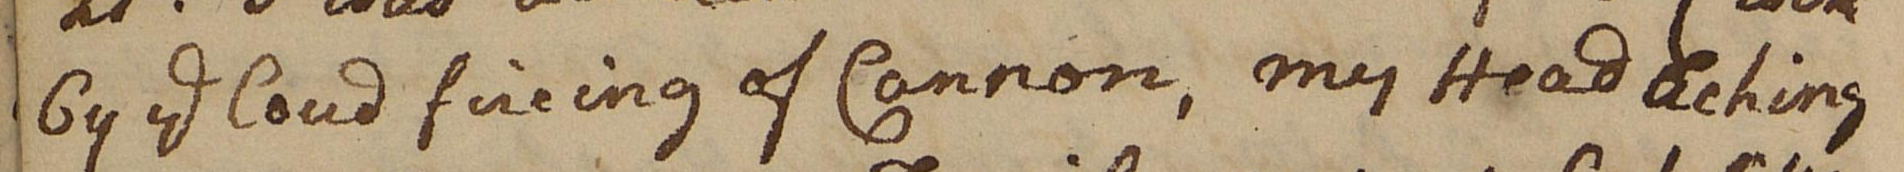by y^e loud fireing of Cannon, my Head Aching
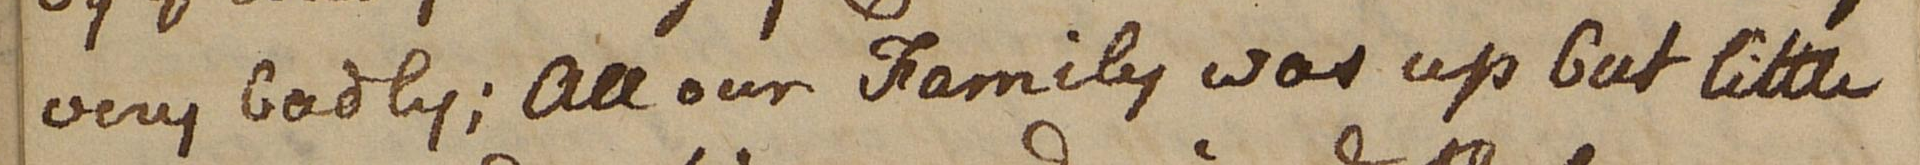very badly; All our Family was up but little
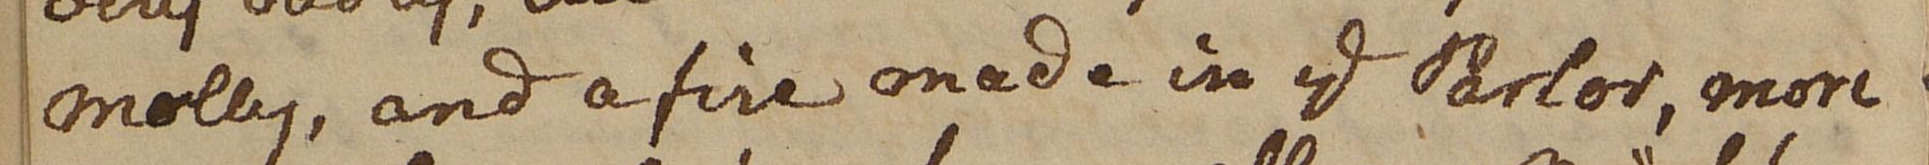Molly, and a fire made in y^e Parlor, more
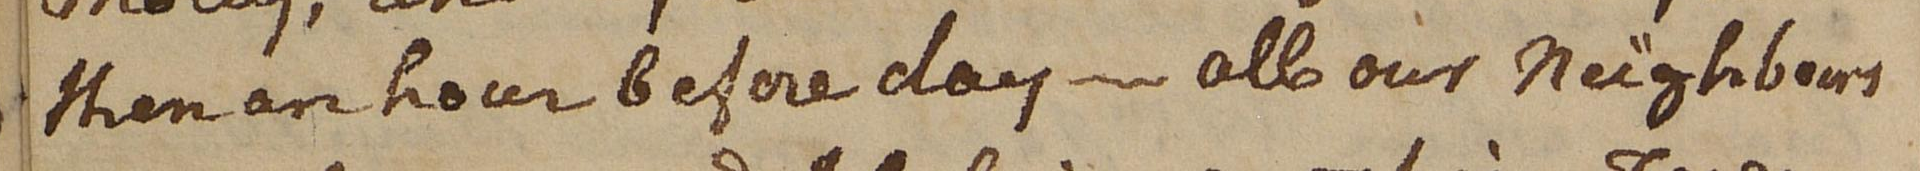then an hour before day- all our Neighbours
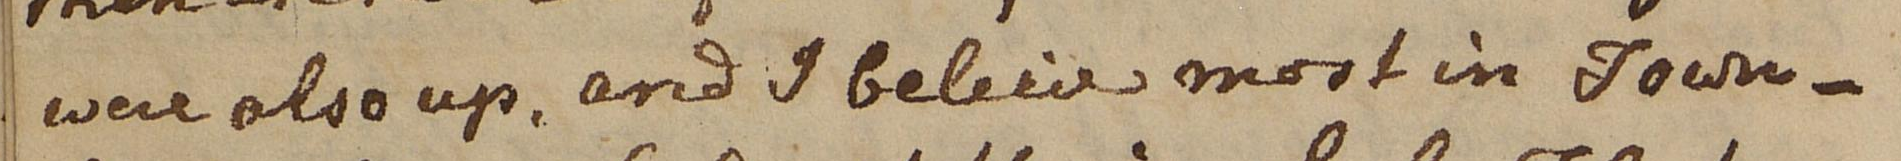were also up, and I beleive most in Town-
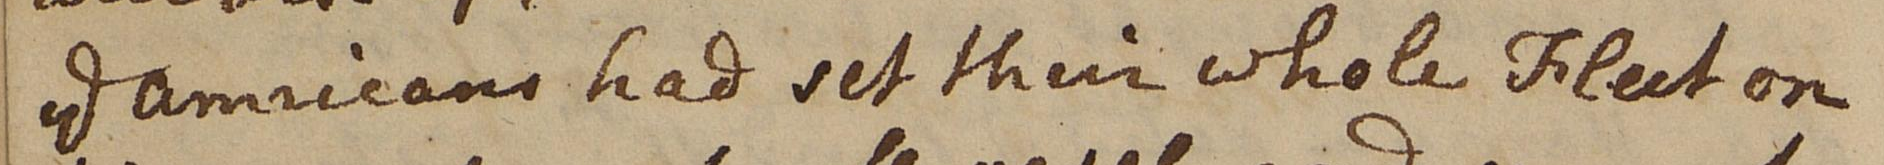y^e Amricans had set their whole Fleet on
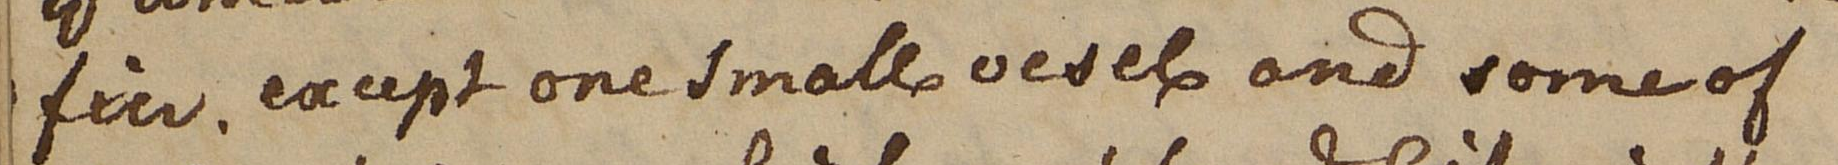fire, except one Small vesel and some of
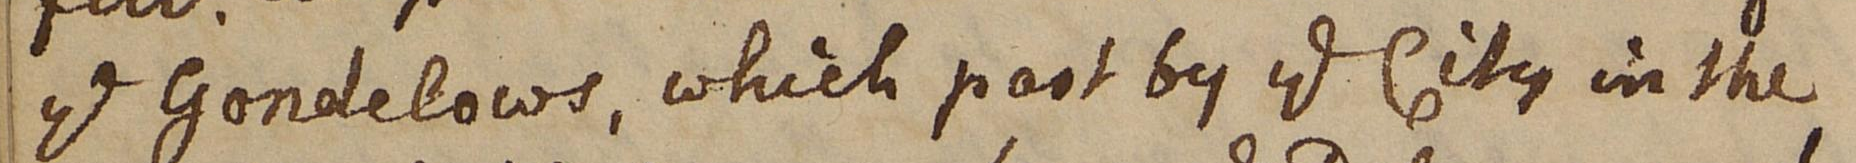y^e Gondelows, which past by y^e City in the
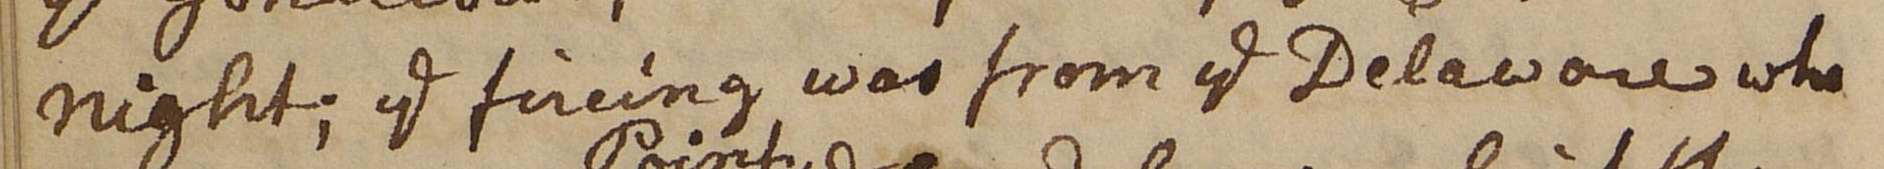night; y^e fireing was from y^e Delaware who
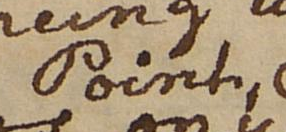Point,
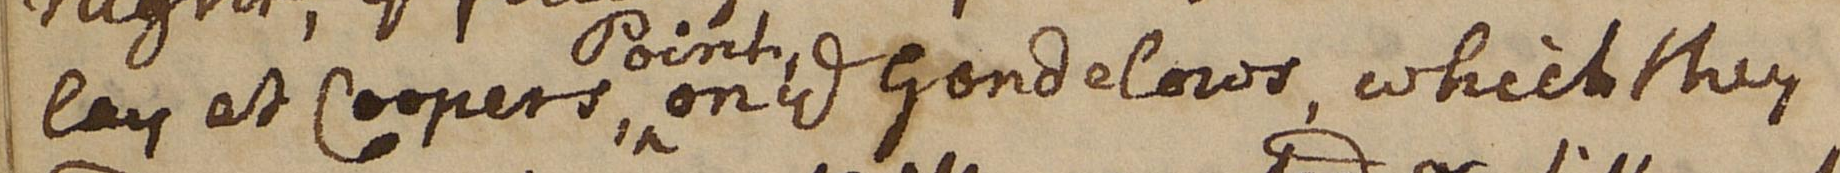lay at Coopers, ^ on y^e Gondelows, which they
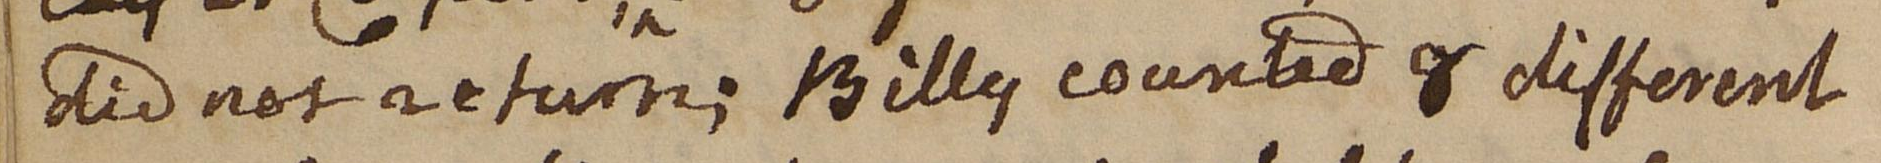did not return; Billy counted 8 different
